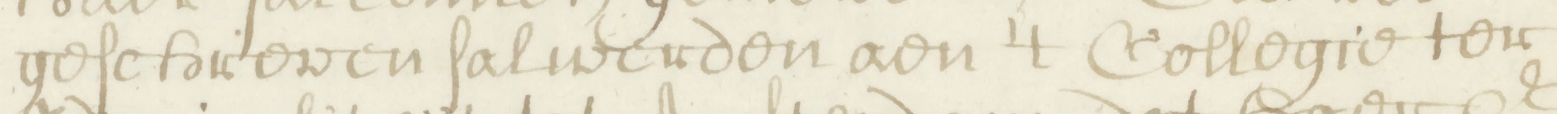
geschreven sal werden aen 't Collegie ter
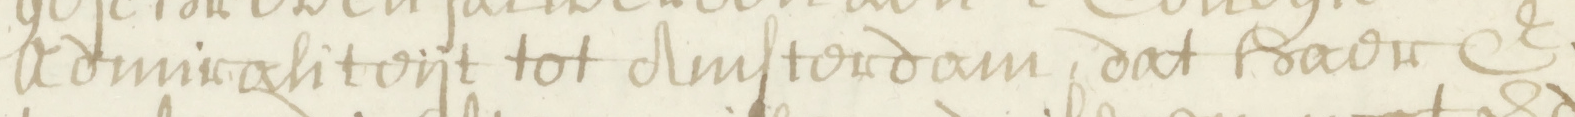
Admiraliteijt tot Amsterdam dat haer E.
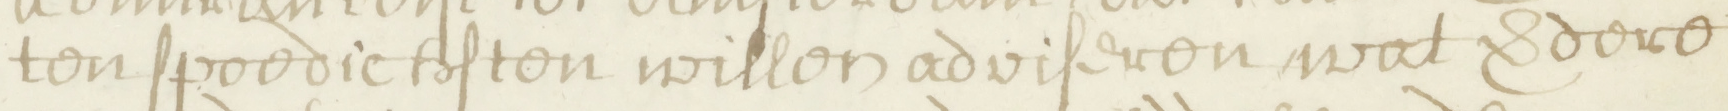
ten spoedichsten willen adviseren wat vdere
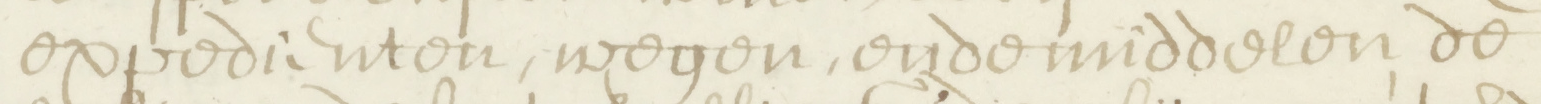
expedienten, wegen, ende middelen de
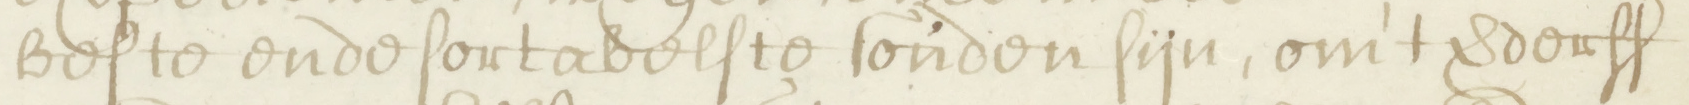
beste ende fortabelste souden sijn, om‛t vderff
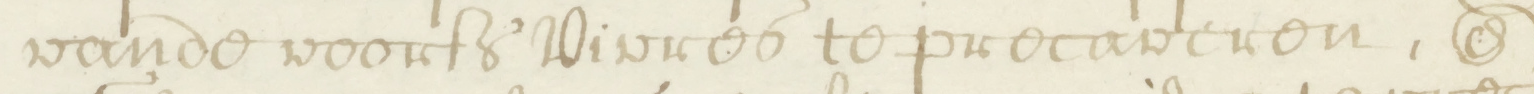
vande voors Vivres te precaveren, &
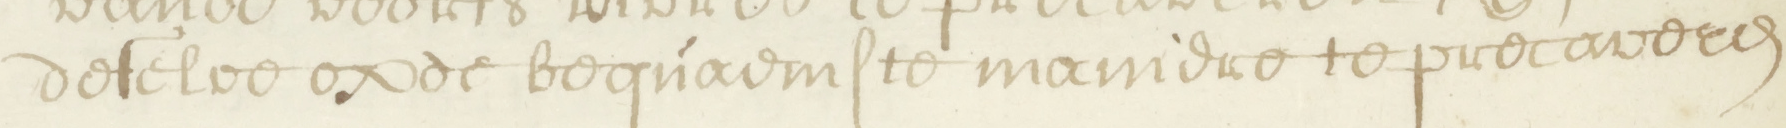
deselve op de bequaemste maniere te precaveren
